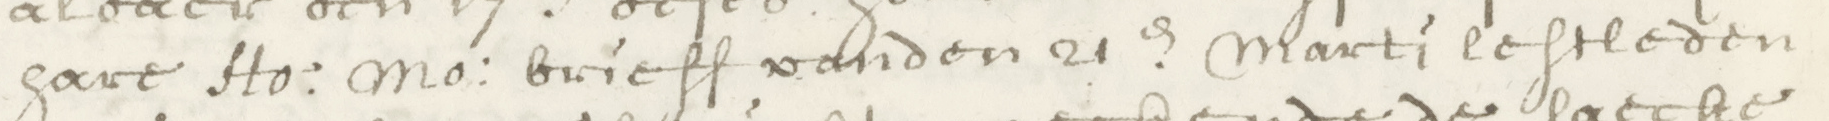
hare Ho:Mo: brieff vanden 21en. Marti lestleden
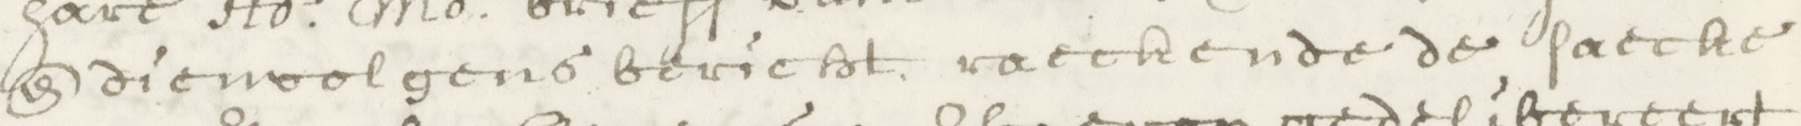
& dienvolgens bericht, raeckende de saecke
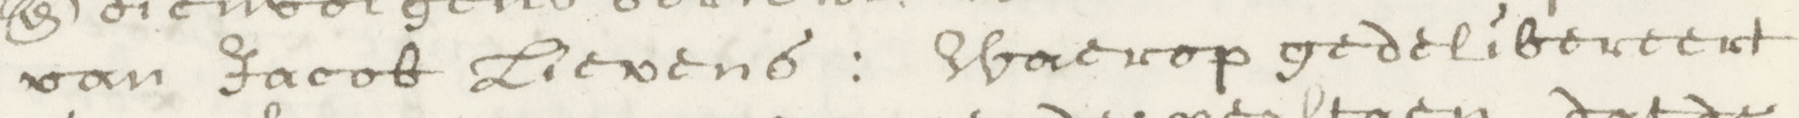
van Jacob Lievens: Waerop gedelibereert
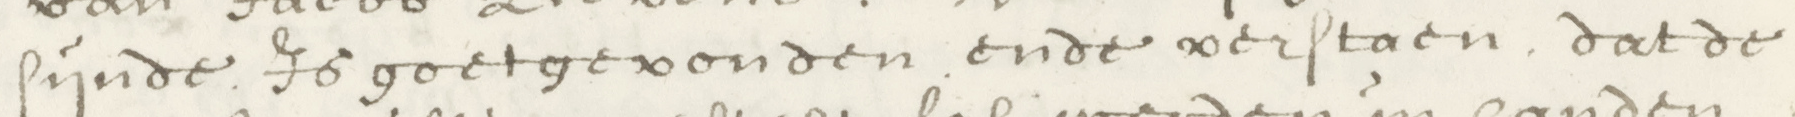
sijnde, Is goetgevonden, ende verstaen, dat de
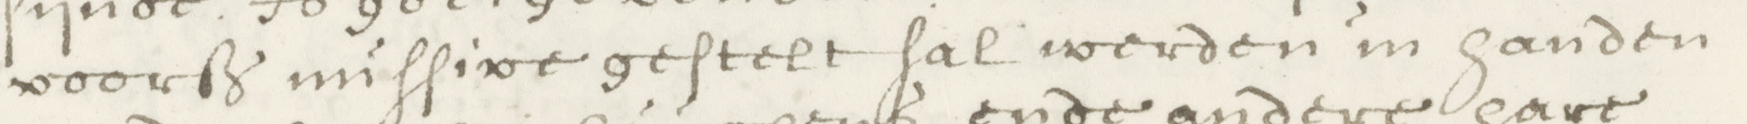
voors missive gestelt sal werden in handen
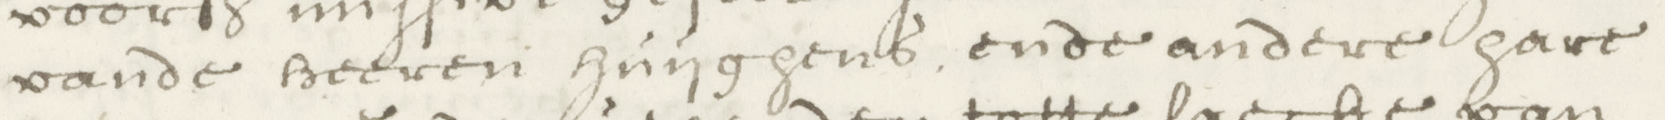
vande heeren huijghens, ende andere hare
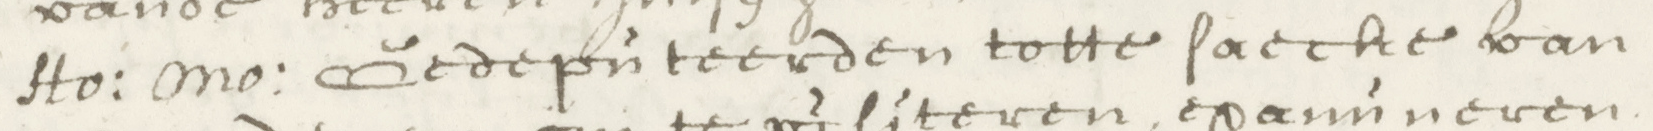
Ho:Mo: Gedeputeerden totte saecke van
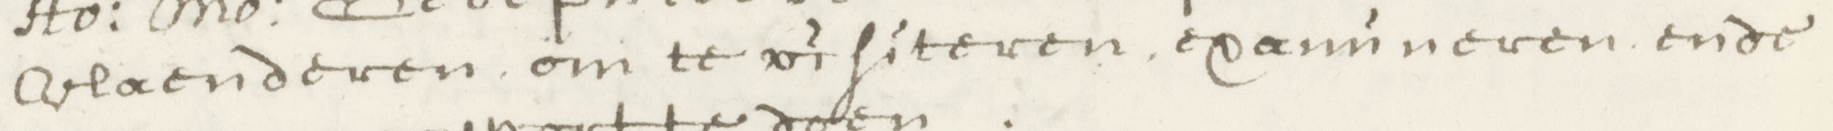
Vlaenderen, om te visiteren, examineren, ende
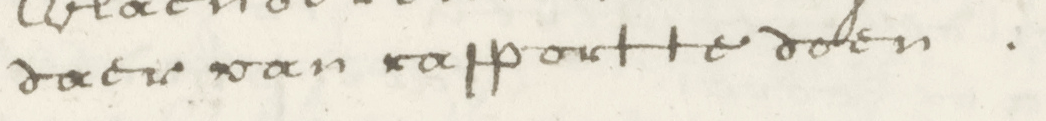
daer van rapport te doen.
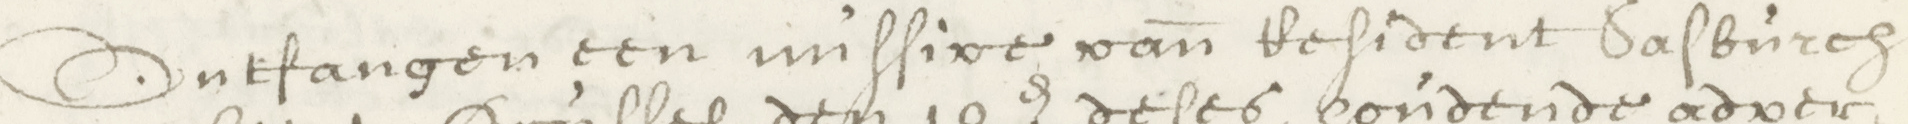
Ontfangen een missive van Resident Sasburch
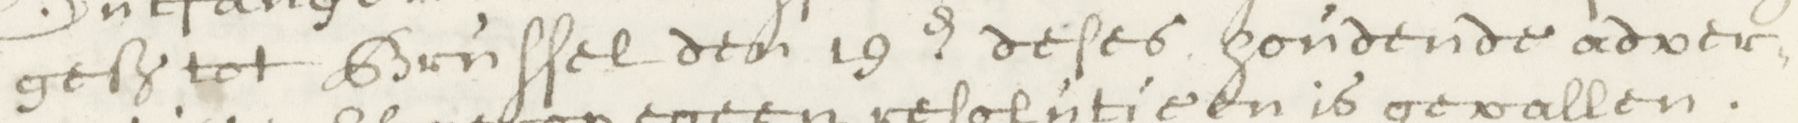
ges tot Brussel de 19en deses, houdende adver,,
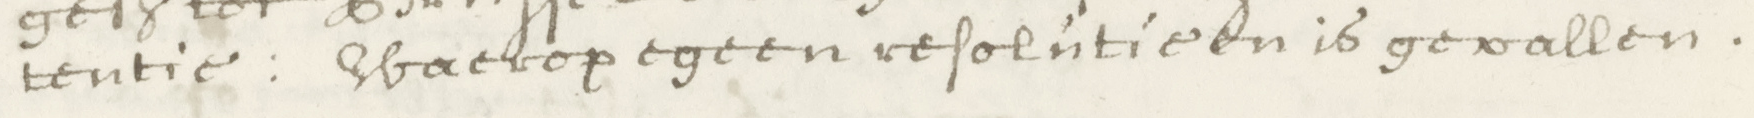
tentie: Waerop egeen resolutie en is gevallen.
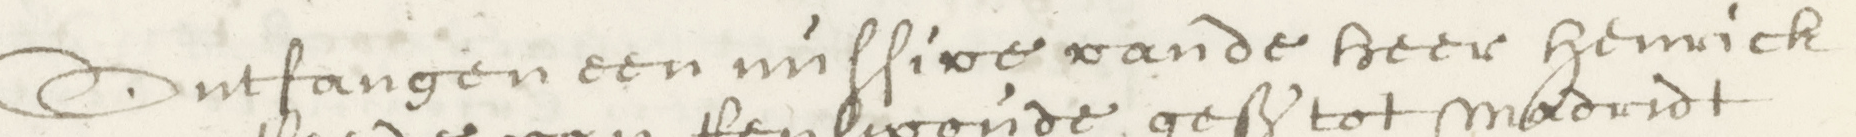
Ontfangen een missive vande heer henrick
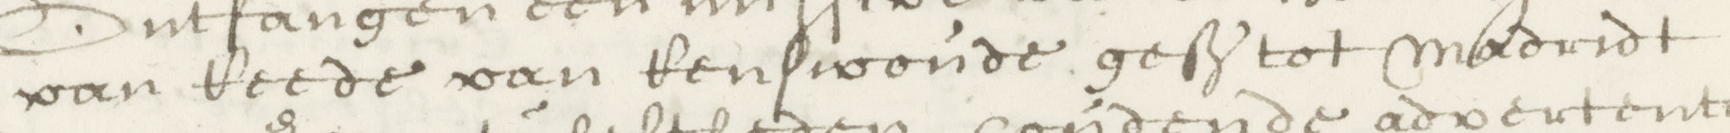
van Reede van Renswoude ges tot madridt
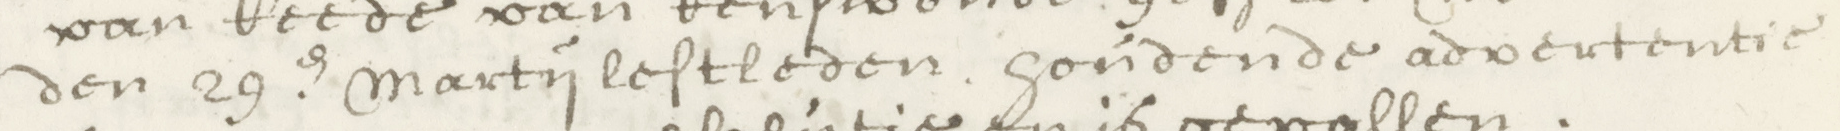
den 29en. Martij lestleden, houdende advertentie
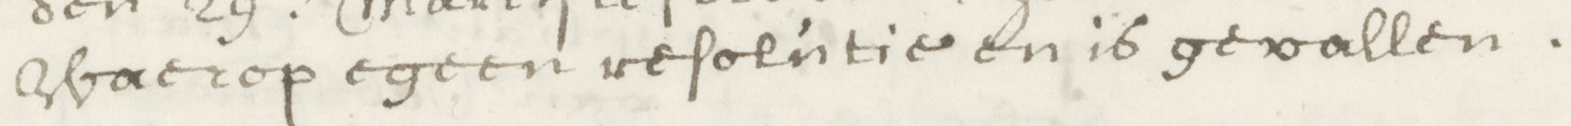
Waerop egeen resolutie en is gevallen.
